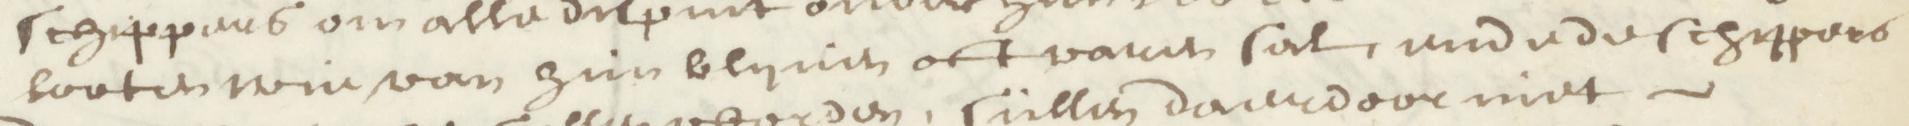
looten wie van hun blyuen off varen sal, ende de schippers
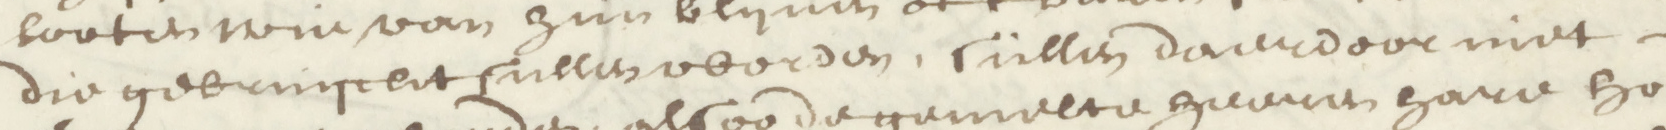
die gebruyckt sullen worden, sullen daerdoor niet
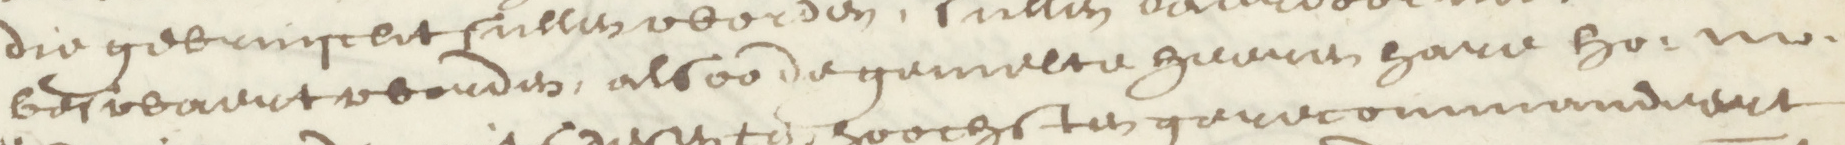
beswaert worden, alsoo de gemelte heeren hare Ho:Mo:
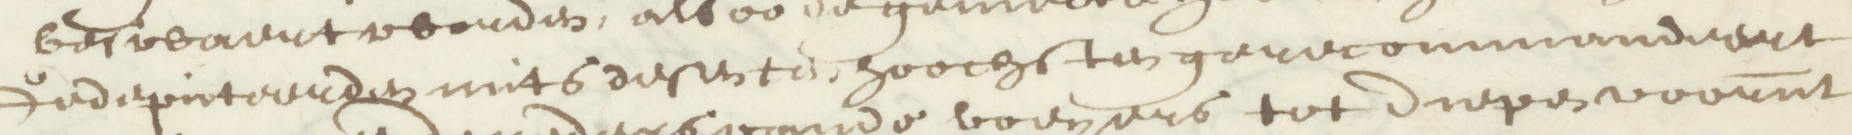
Gedeputeerden mits desen ten hoochsten gerecommandeert
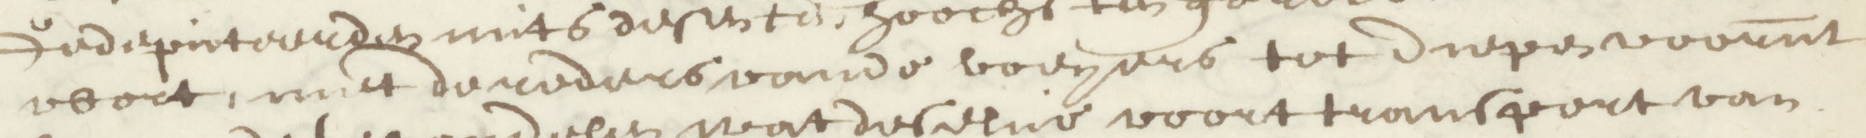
wort, mit de reders vande boeyers tot diepen voornt
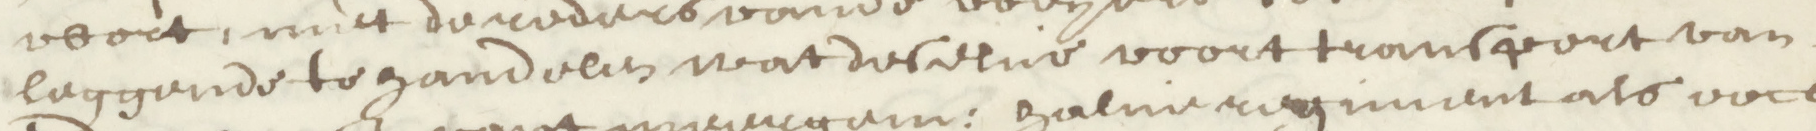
leggende te handelen wat deselue voort transport van
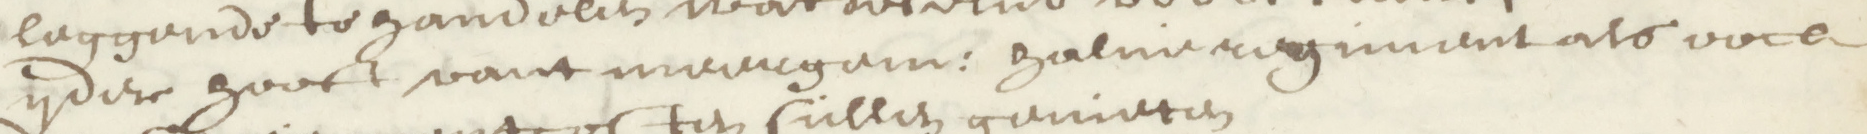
yder hooft vant meergem: halue regiment als oock
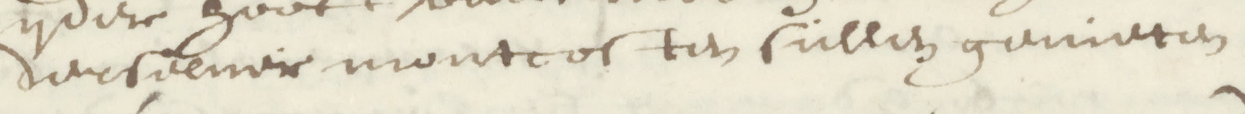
derseluer montcosten sullen genieten
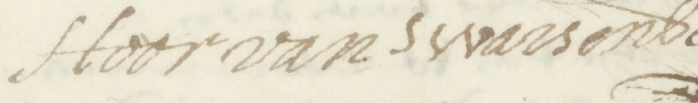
Heer van Swarsenb.
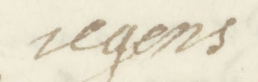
iegens
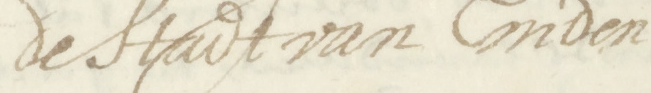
de Stadt van Emnden
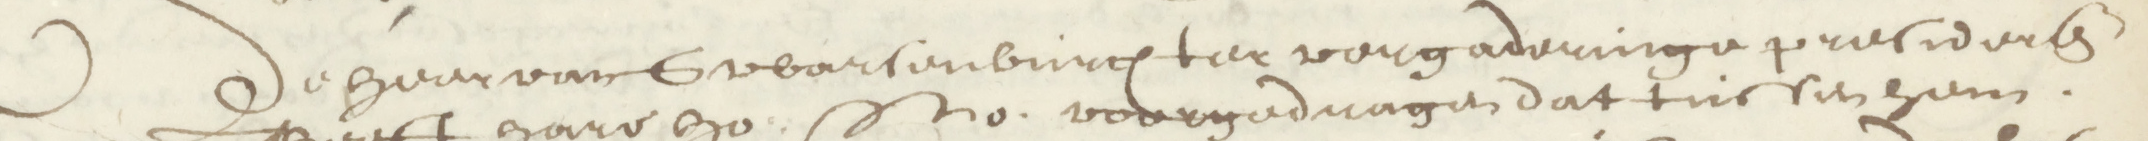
De heer van Swarsenburch ter vergaderinge presidere
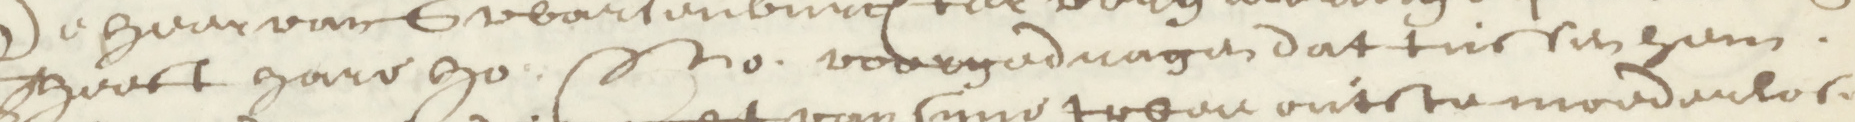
heeft hare Ho:Mo: voorgedragen dat tussen hem
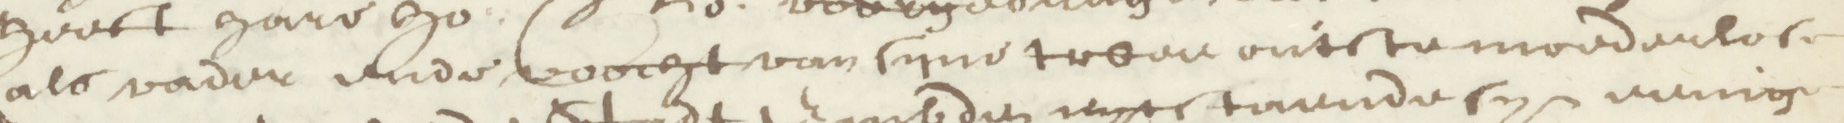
als vader ende voocht van syne twee outste moederlose
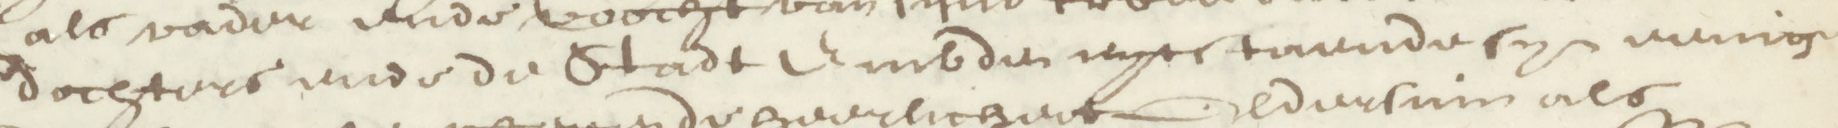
dochters ende de Stadt Embden uytstaende syn eenige
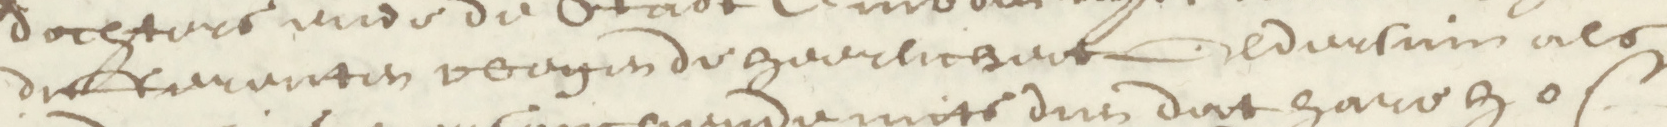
differenten wegen de heerlicheit Oldersum als
